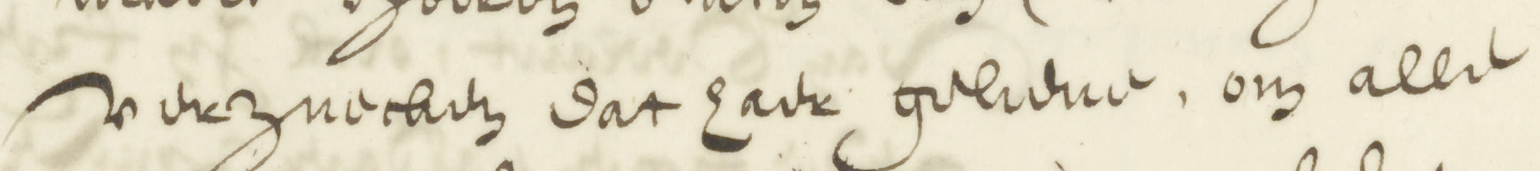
verzuecken dat haer gelieue om alle
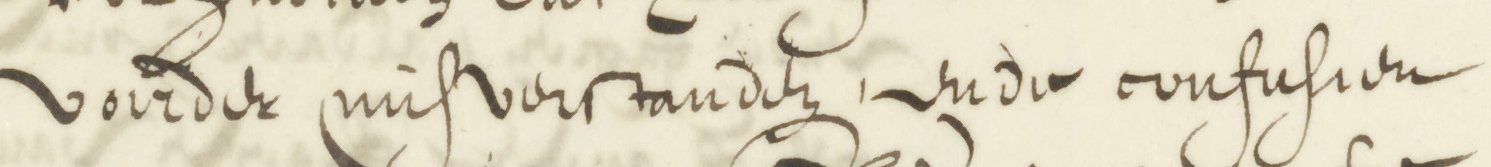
voirder misverstanden ende confusien
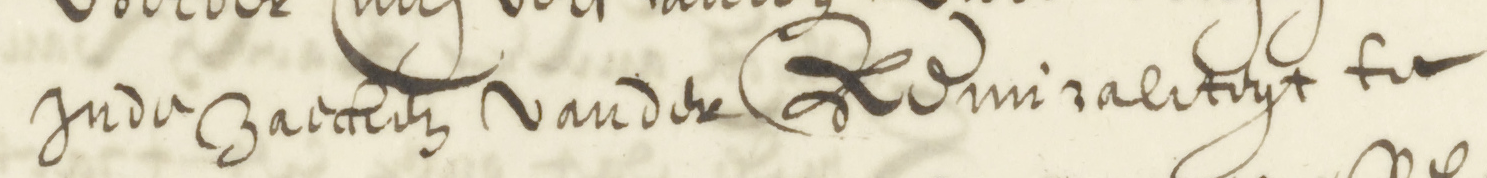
inde zaecken van der Admiraliteyt te
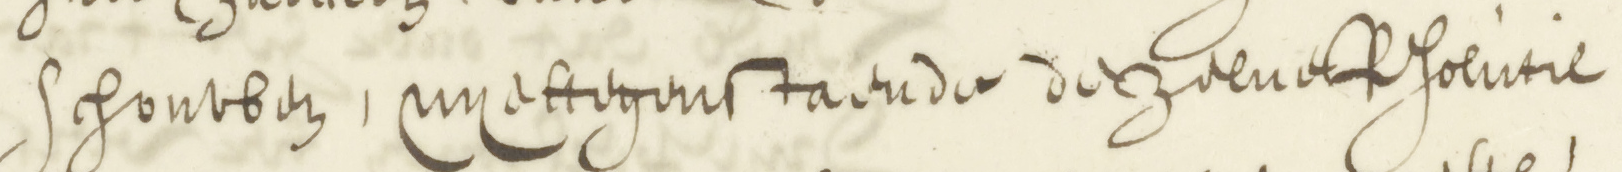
schouwen, nyettegenstaende derzelue Resolutie
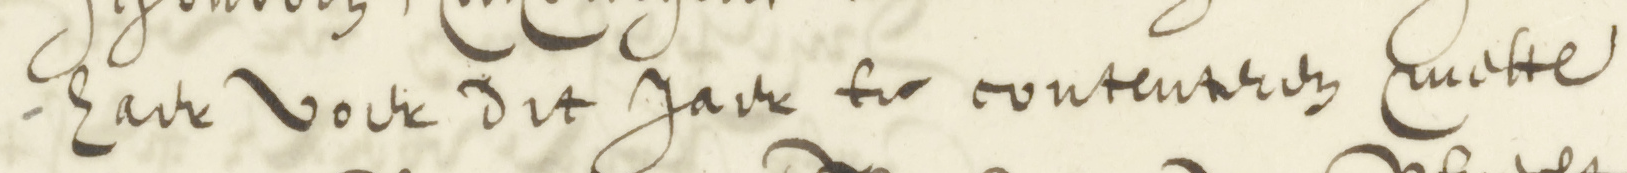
haer voer dit Jaer te contenteren mette
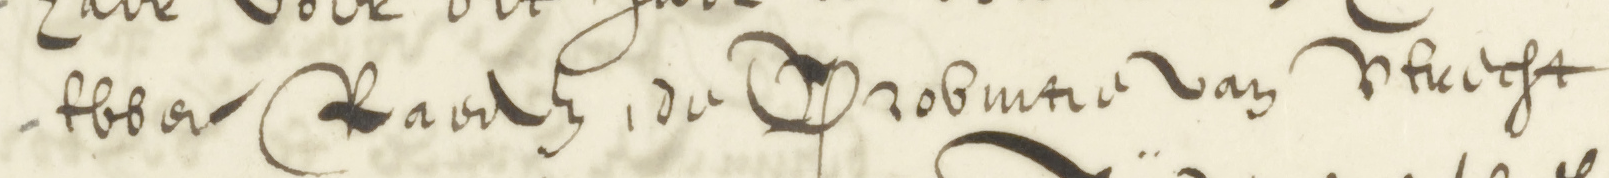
twee Raeden, de Provintie van Utrecht
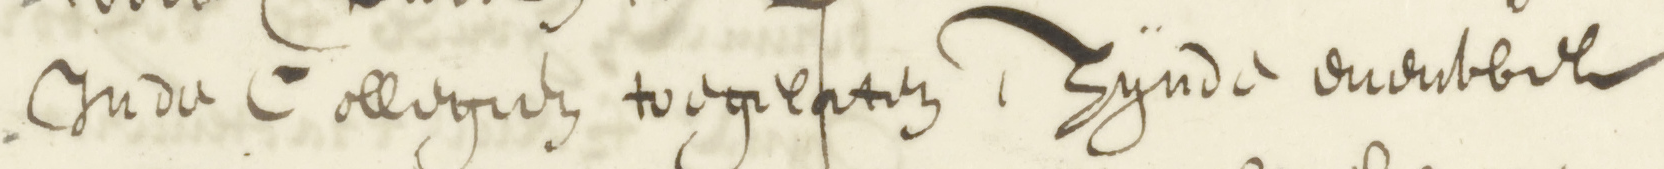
inde Collegien toegelaten, Zijnde euenwel
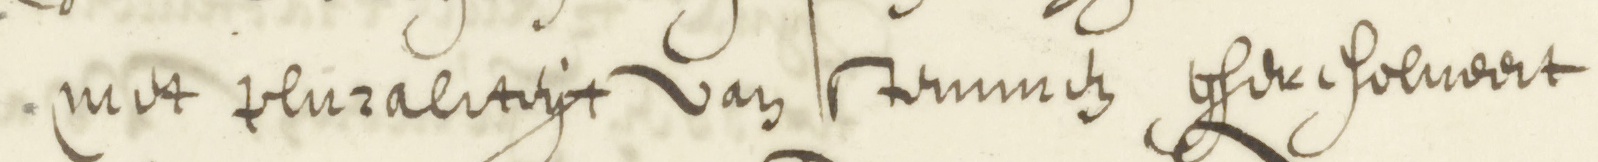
met pluraliteijt van stemmen geresolueert
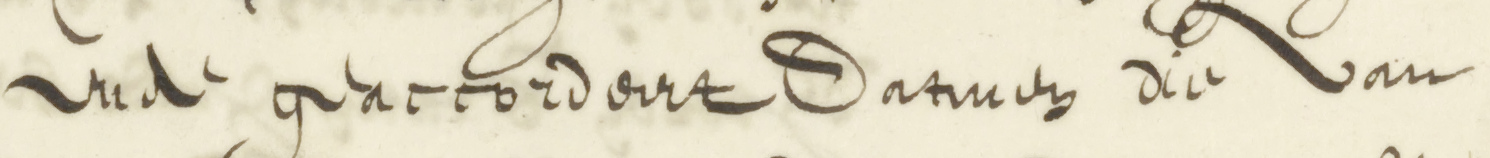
ende geaccordeert Datmen die van
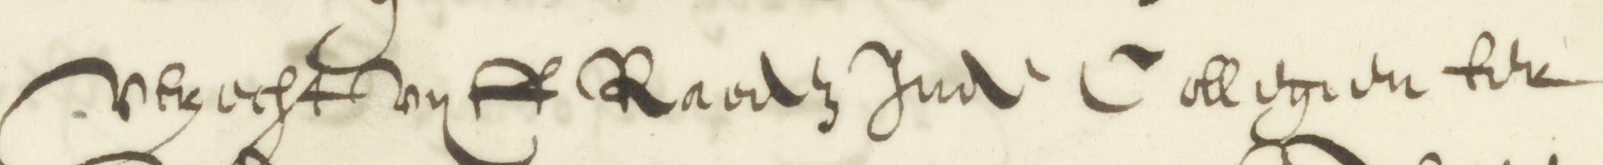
Utrecht vyff Raeden inde Collegien ter
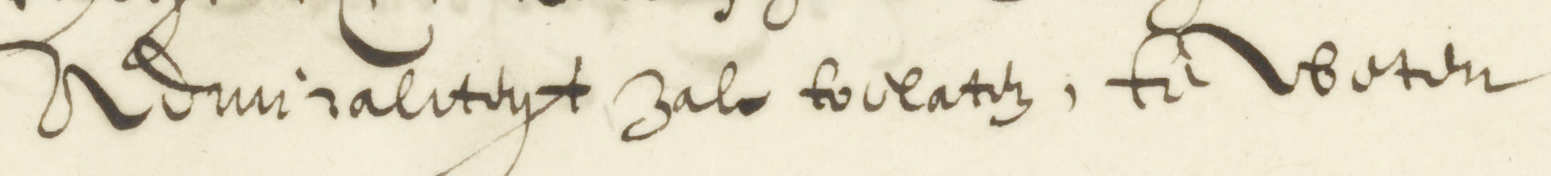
Admiraliteyt zal toelaten, te weten
